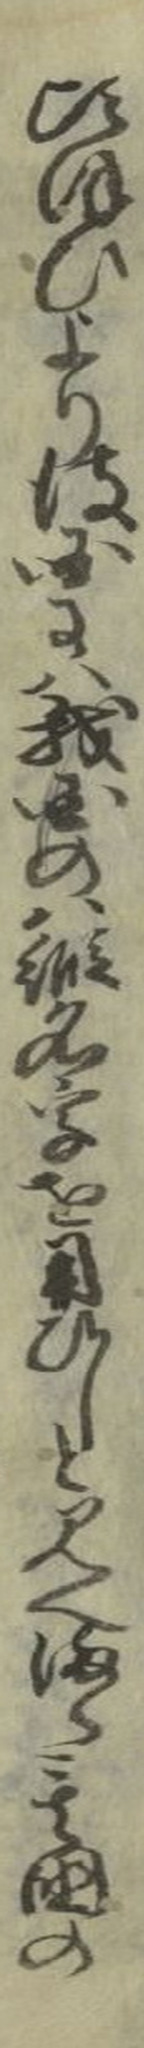頃ほひより彼国には我国のは仮名字を用ひしと見へさらに其国の
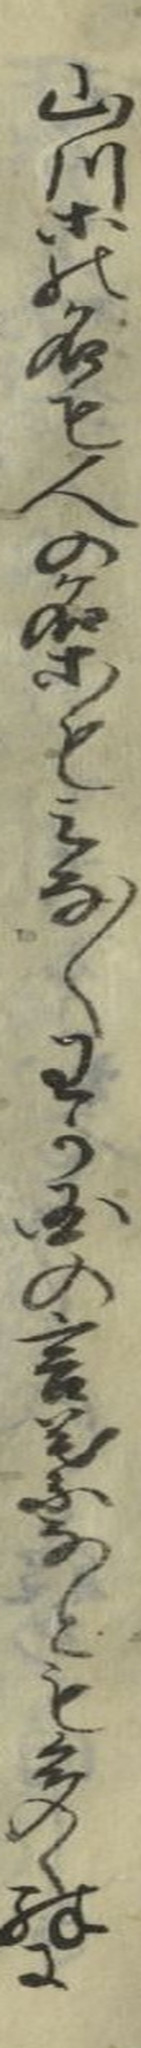山川等の名も人の名等もみな〳〵わか国の言葉なとも多く殊に
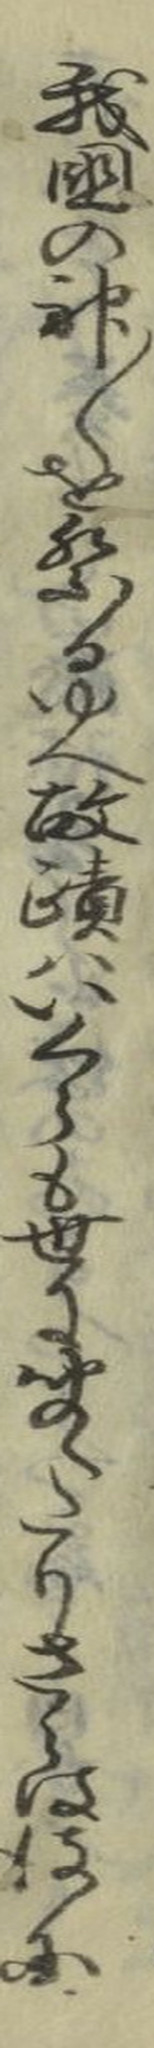我国の神〳〵を祭るゆへ故蹟はいくらも世に聞へたりさらは彼国
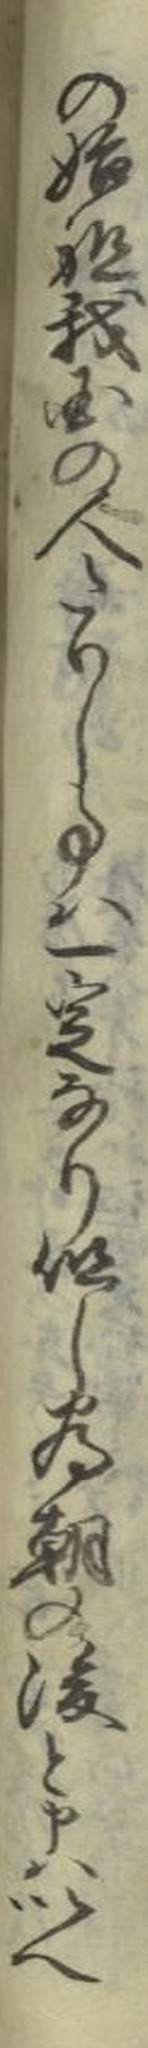の始祖我国の人たりし事は一定なり但し為朝の後と申はいへ
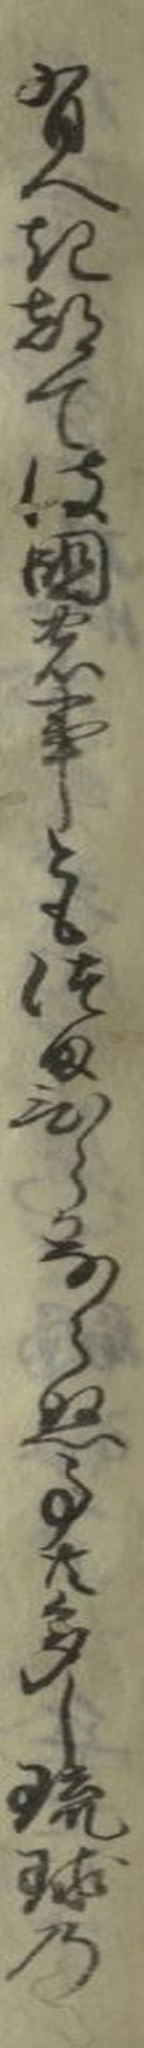有へき都て彼国悪事ともつまひらかならぬ事共多し琉球の
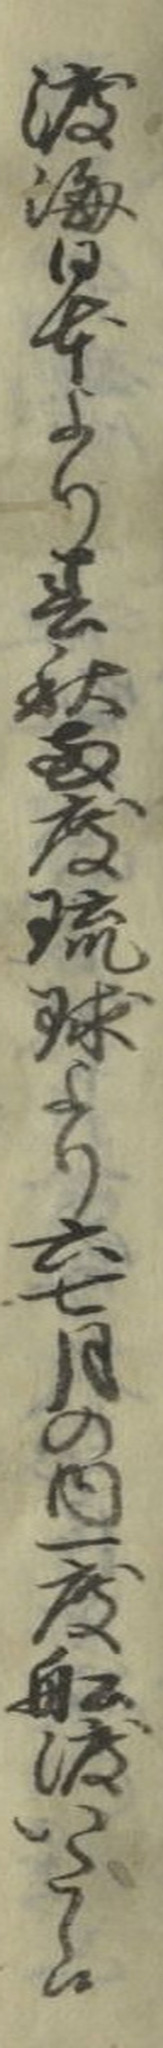渡海日本より春秋両度琉球より六七月の内一度舩渡いたし候

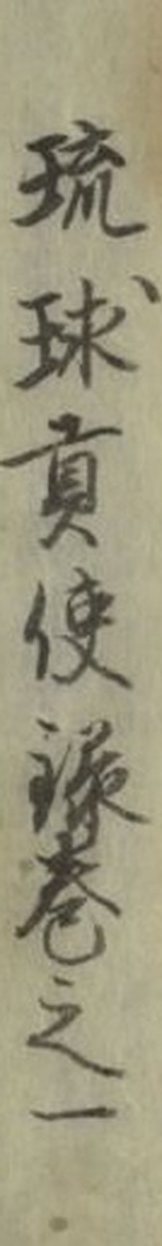琉球貢使録巻之一
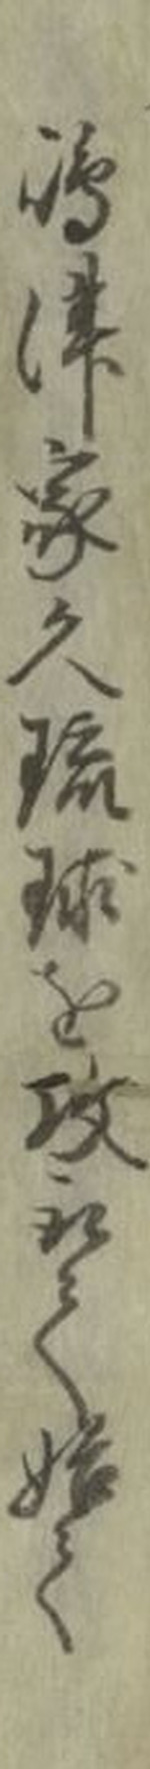嶋津家久琉球を攻取て始て
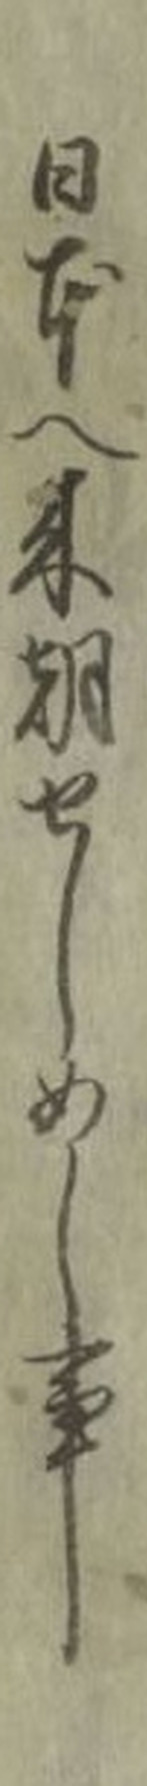日本へ来朝せしめし事
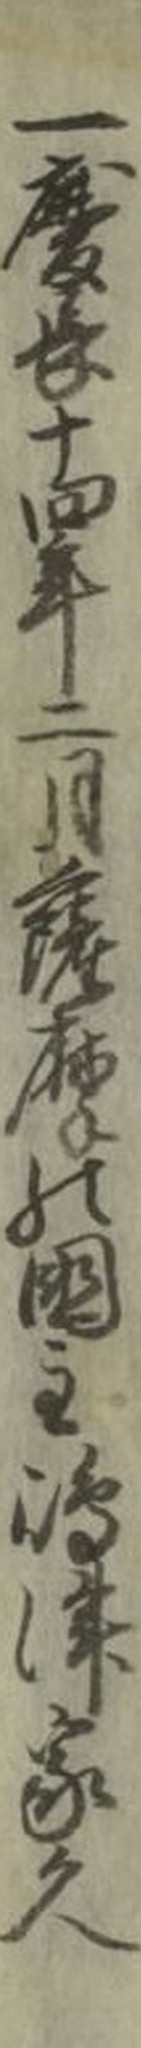一慶長十四年二月薩摩の国主嶋津家久
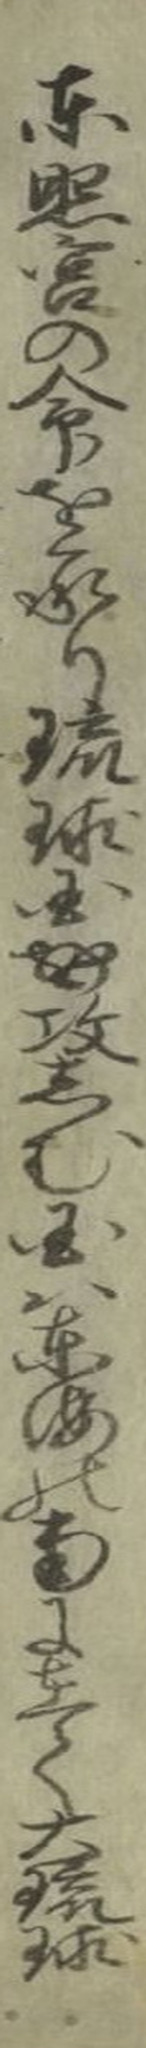東照宮の命を承り琉球国攻しむ国は東海の南に在て大琉球
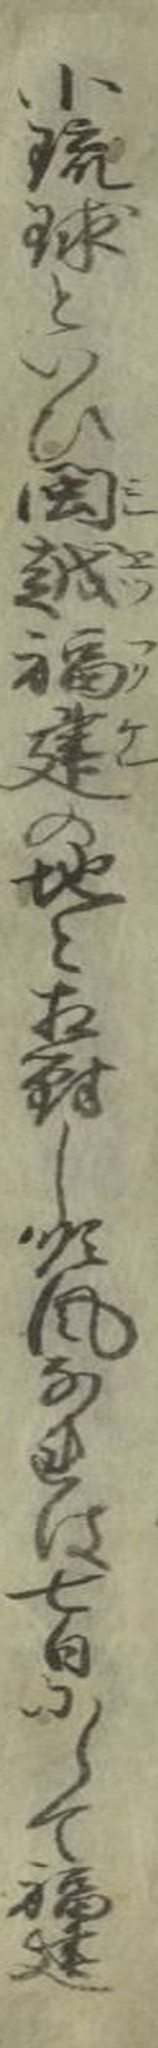小琉球といひ閩越福建の地と相対し順風なれは七日にして福建
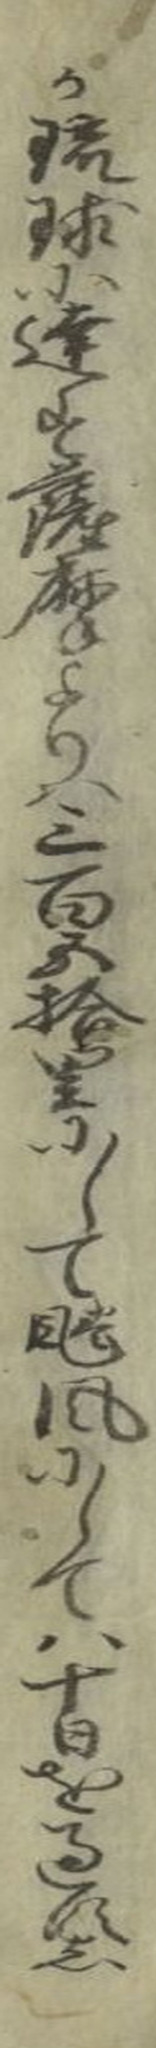か琉球に達す薩摩よりは三百五拾里にして颶風にしては十日を過すし
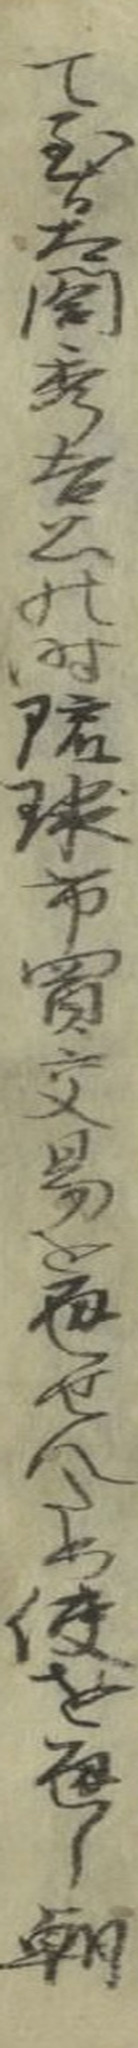て至る太閤秀吉公の時琉球市買交易を通せんため使を通し朝
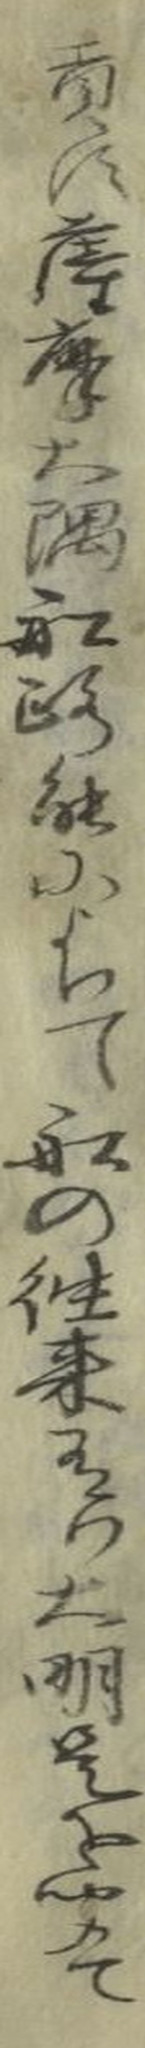貢す薩摩大隅舩路能によりて舩の往来有り大明是を聞て
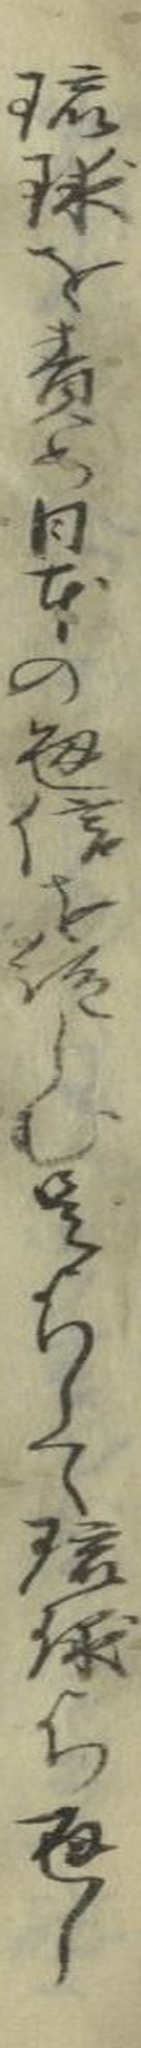琉球を責め日本の通信を絶しむ是よりして琉球より通し
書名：琉球人来朝之記
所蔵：University of the Ryukyus Library
